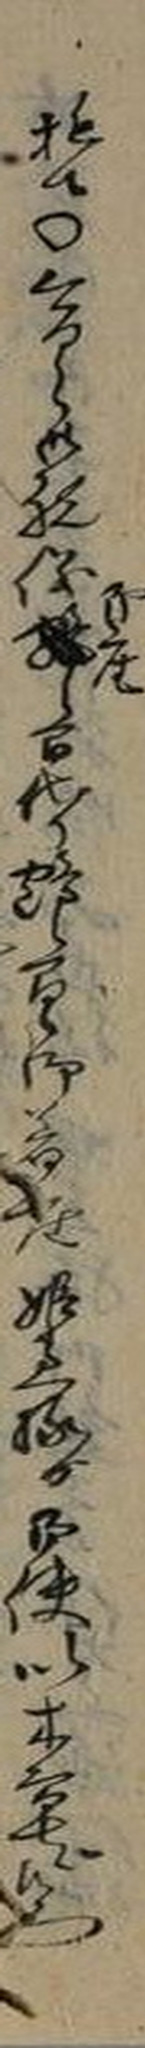遊候〇今日之御祝儀御座之間代り鶴之間御着座姫君様ゟ御使以木曽七郎左衛門
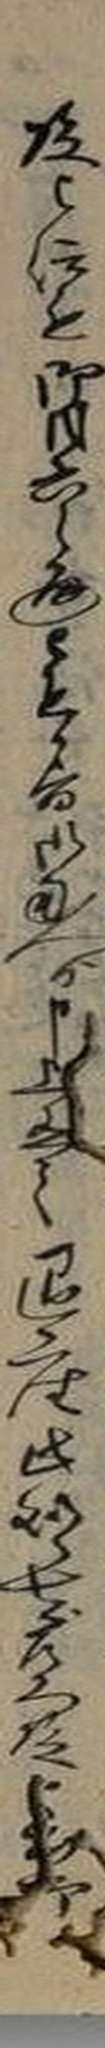殿被仰進御目六之通被進候旨御用人ゟ申上有之退座此処へ七郎左衛門殿被出御
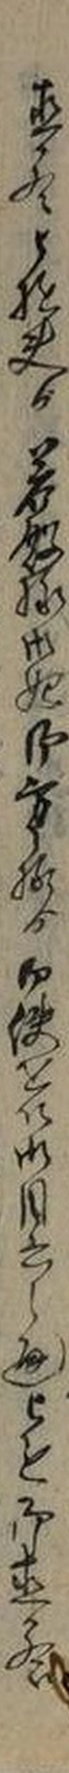直答被遊夫ゟ若殿様御始御方々様ゟ御使を以御目六之通被進御直答
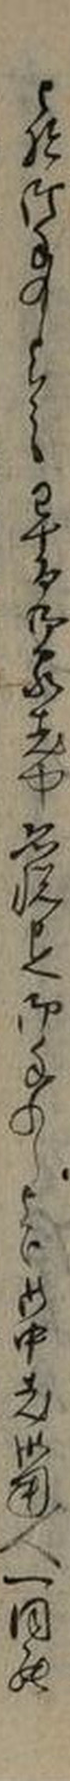被遊御手のし被下之畢而御家老中恐悦申上御手のし被下御中老御用人一同罷
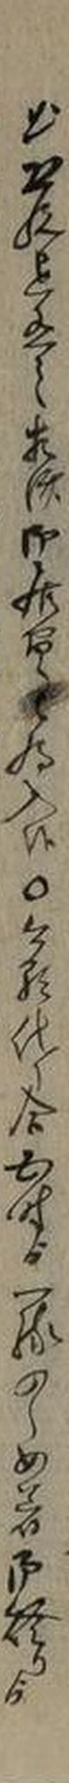出恐悦申上有之相済御居間へ被為入候〇今朝代り合五時ゟ一統のしめ着御終りゟ
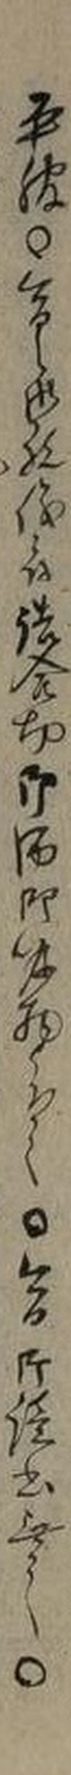平服〇今日御祝儀ニ付詰合切御酒御吸物被下之〇今日御読書無之〇
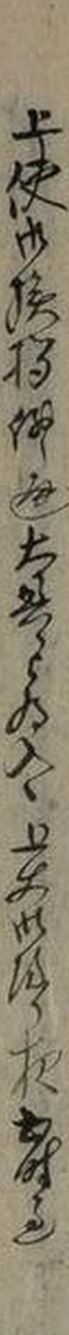上使御挨拶例之通大奥へ被為入候上使御帰り夜五時過
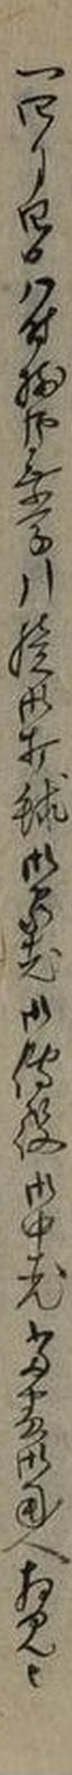一四月四日八時揃御乗馬引続御打毬御家老御傅役御中老当番御用人拝見被
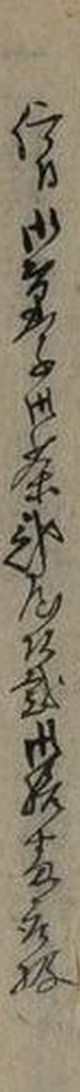仰付御菓子御茶部屋頂戴御膳番取扱
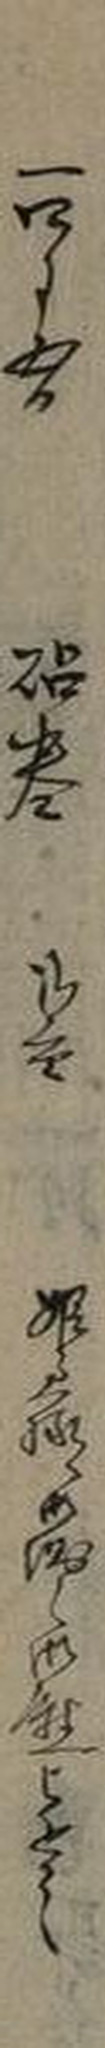一四月五日砧巻弐重姫君様へ御側之御慰被進之
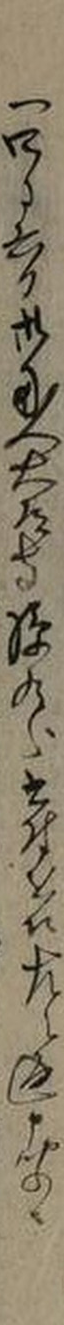一四月六日御用人大道寺孫九郎書付を以左之通申聞候
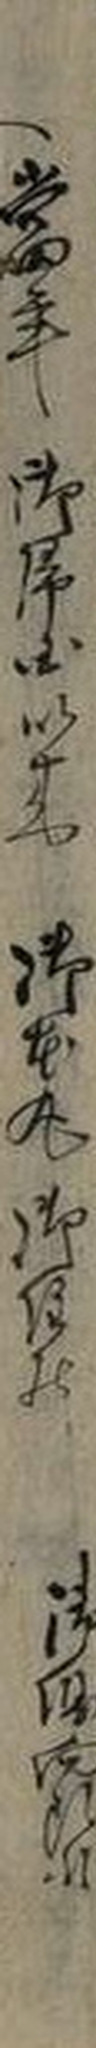当年御帰国以来御本丸御住居御側向頭取
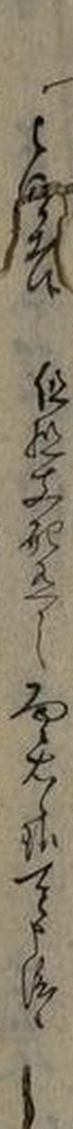被仰出候但組支配有之面々右之趣可被申渡候

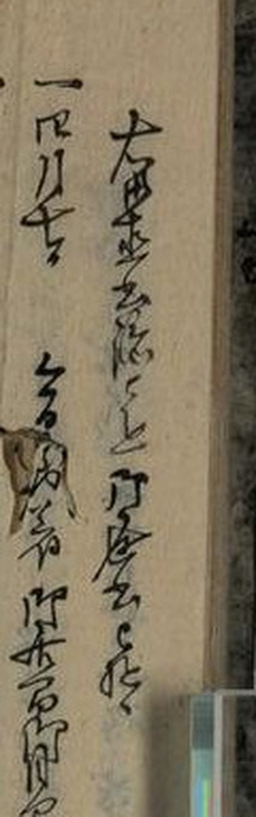右御直書添被進御返書被遊候
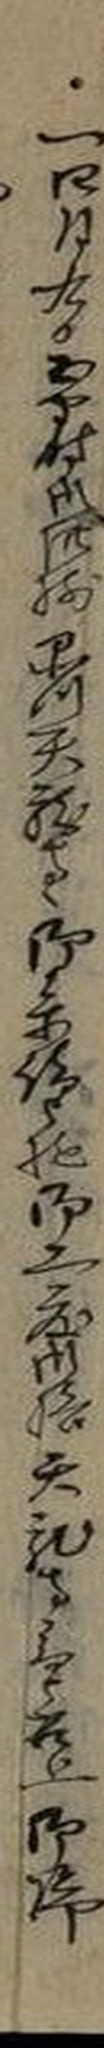一四月九日五半時御供揃品川天龍寺御参詣被遊御二度御膳天龍寺ニ而被召上御帰
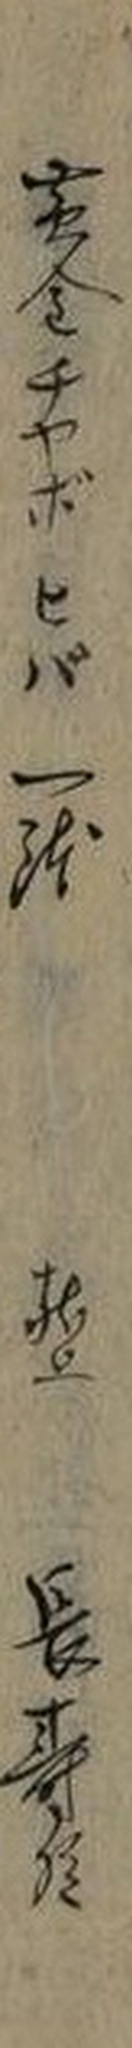黄金チャボヒバ一鉢献上長寿殿
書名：少傅日録抄（斉承付側向頭取日記、在府）
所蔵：福井県文書館 Fukui Prefectural Archives
